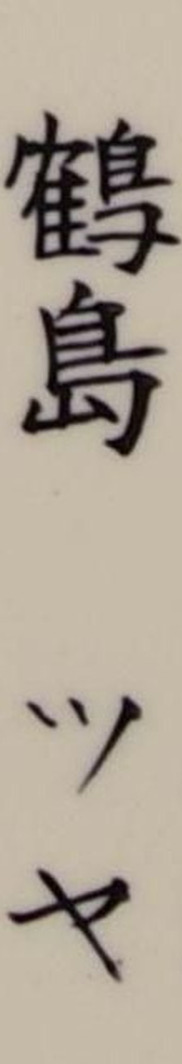鶴島ツヤ
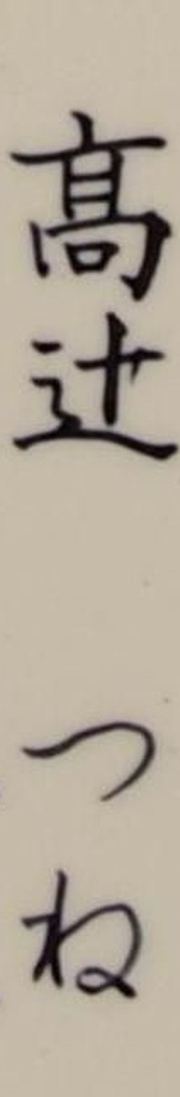高辻つね
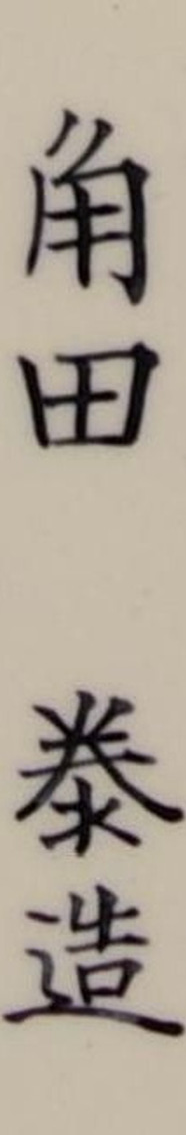角田泰造
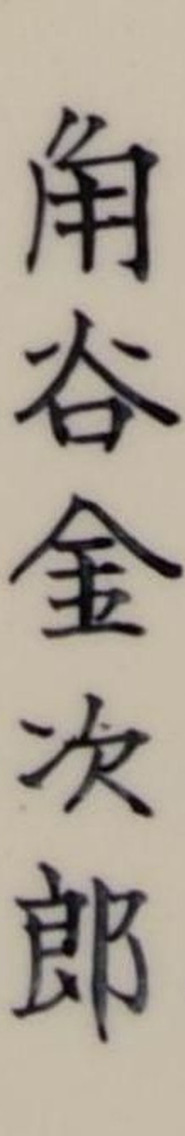角谷金次郎
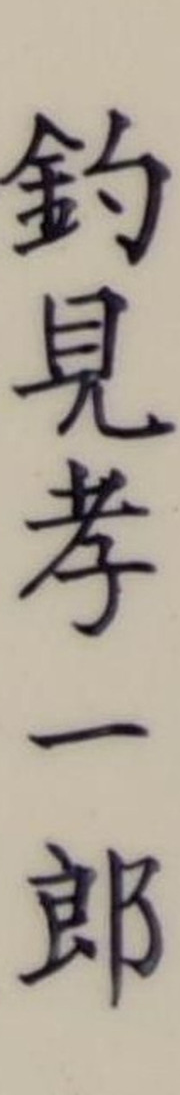釣見孝一郎
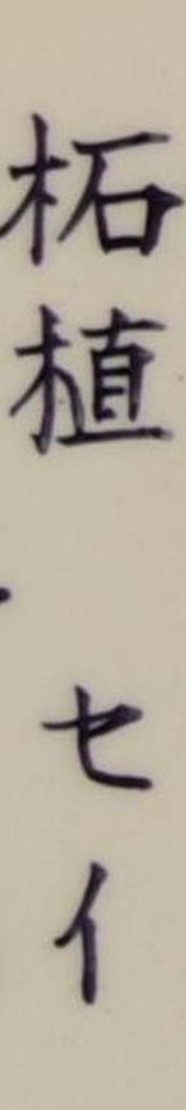栢植セイ
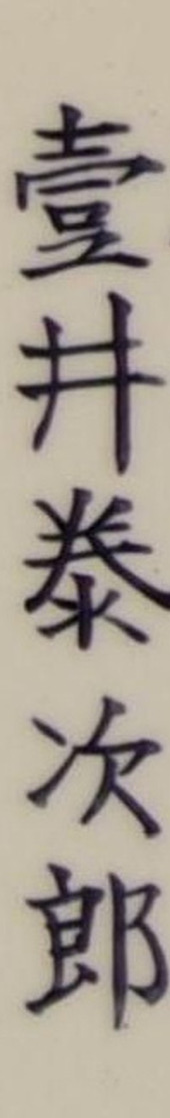壹井泰次郎

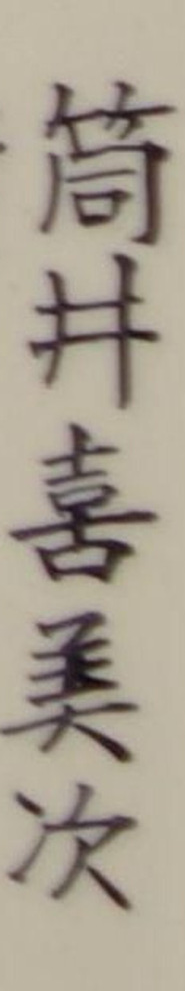筒井喜美次
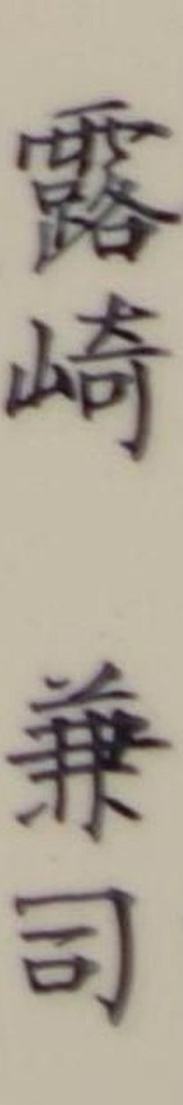露崎兼司
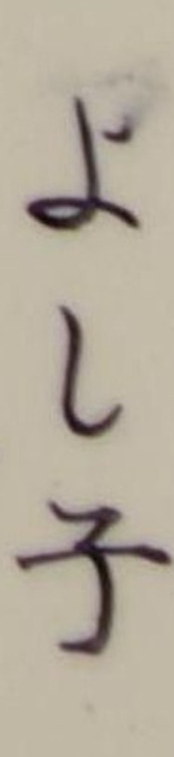よし子
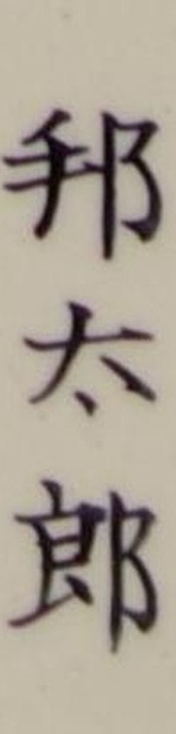邦太郎
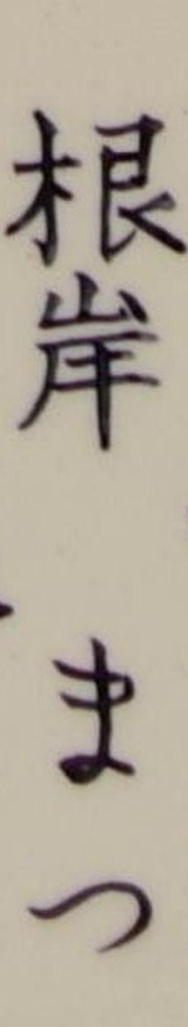根岸まつ
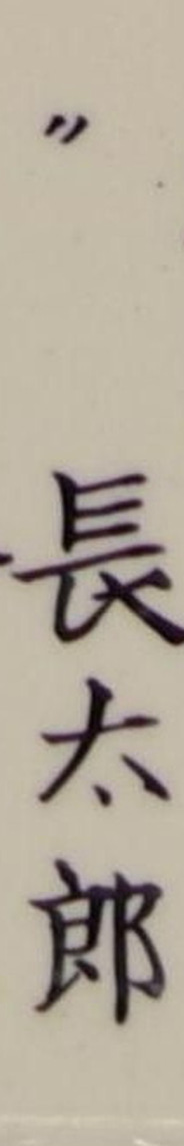長太郎
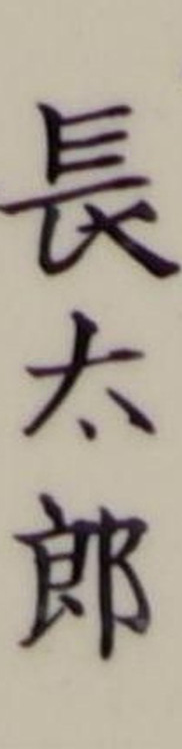長太郎
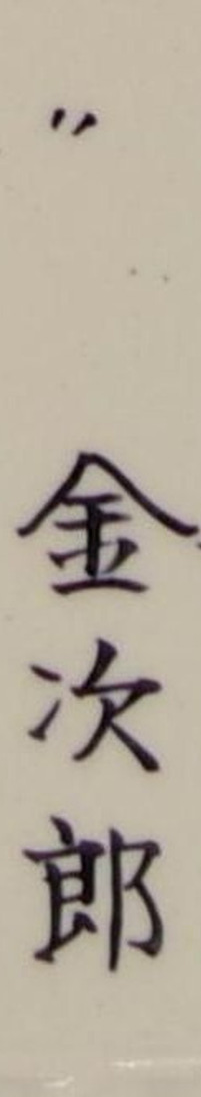金次郎
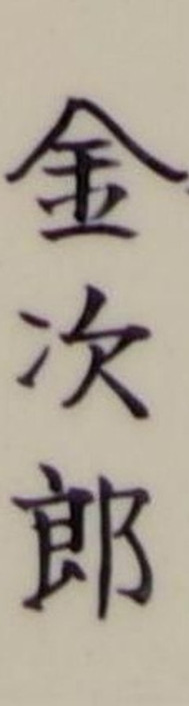金次郎
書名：E~L
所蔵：高野山金剛峯寺
